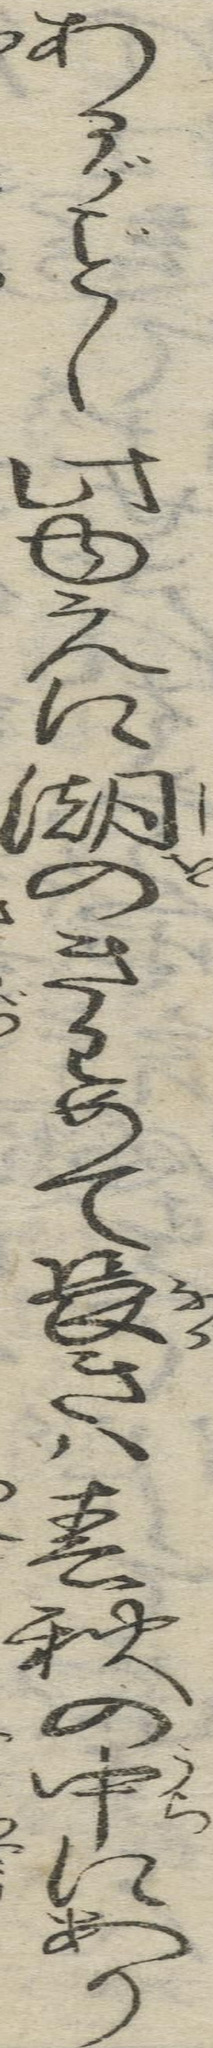あるがごとし此ゆえに潮のきわめて長きは春秋の中にあり
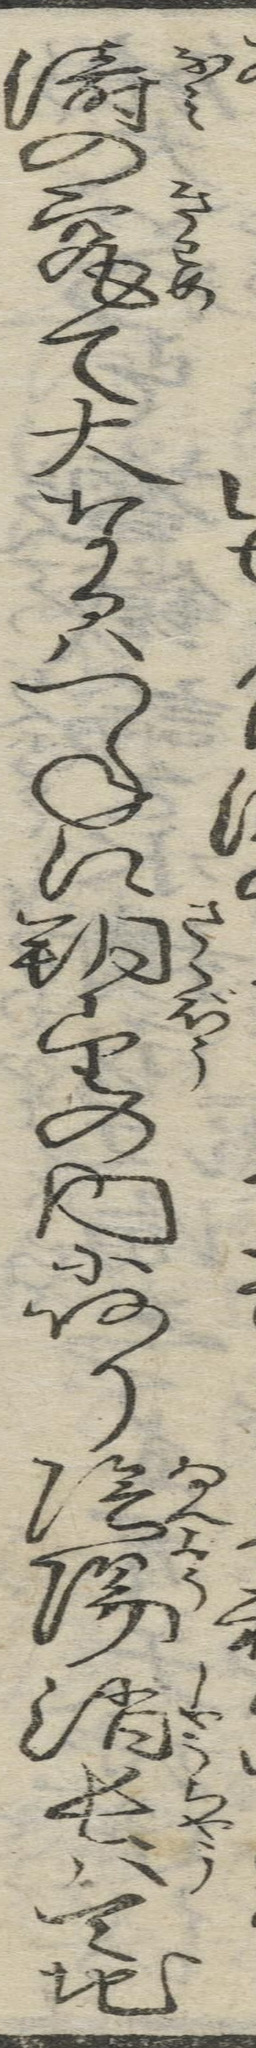濤の究て大なるはつねに朔望の内にあり陰陽消長は天地
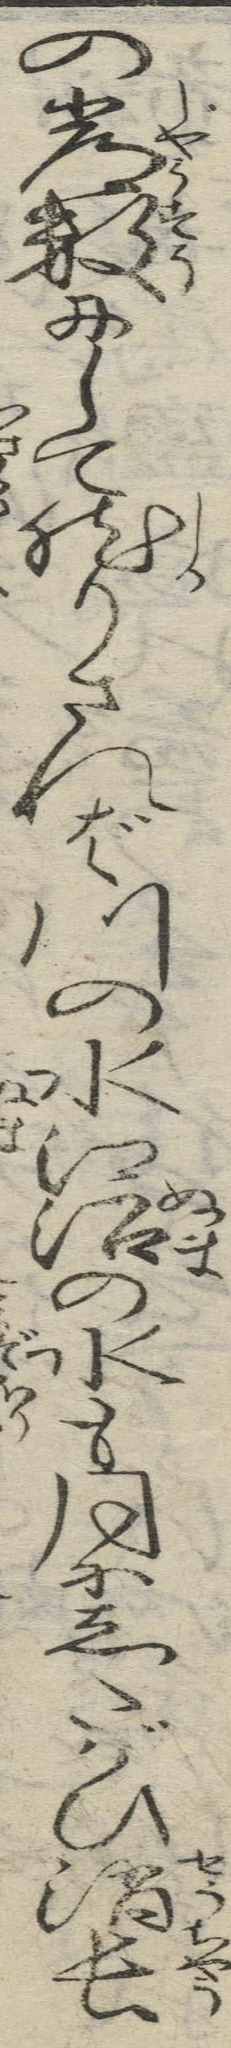の常数にして然りされば川の水に沼の水も月にしたがひ消長
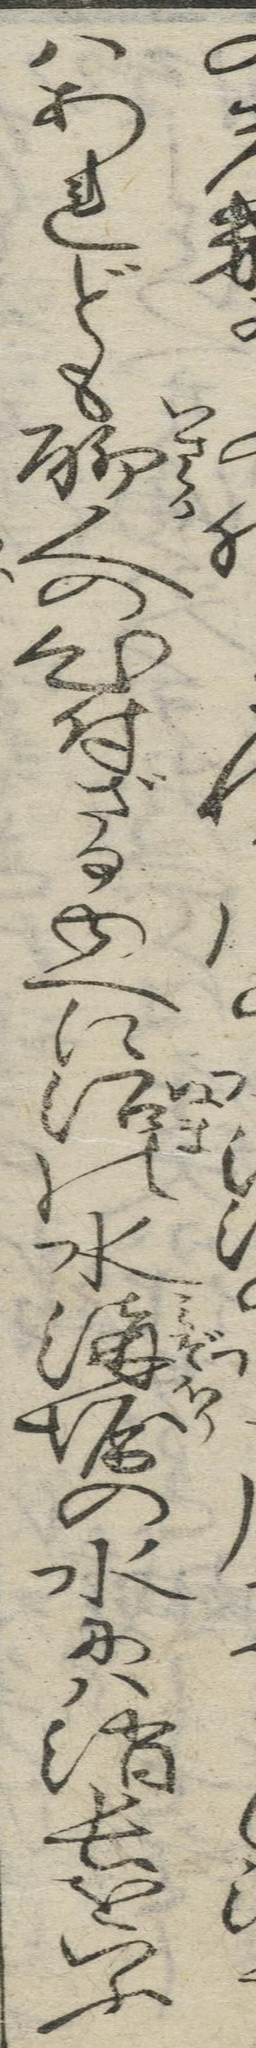はあれども聊人の心付ざるゆへに沼の水溝掘の水には消長をいふ
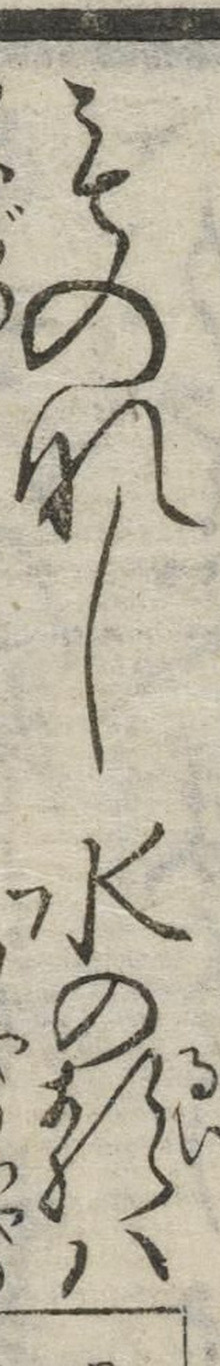ものなし水の類は
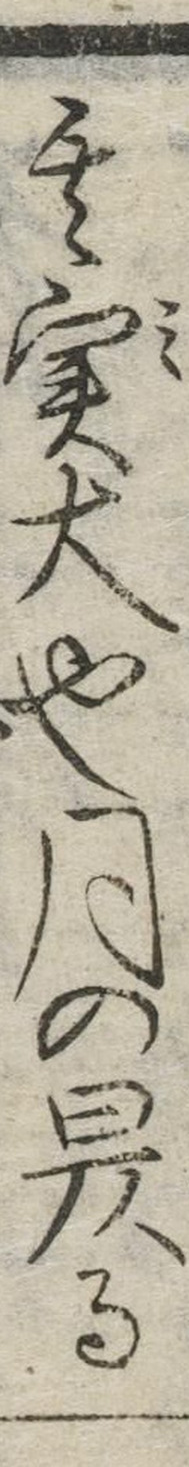其実大也月の昃る
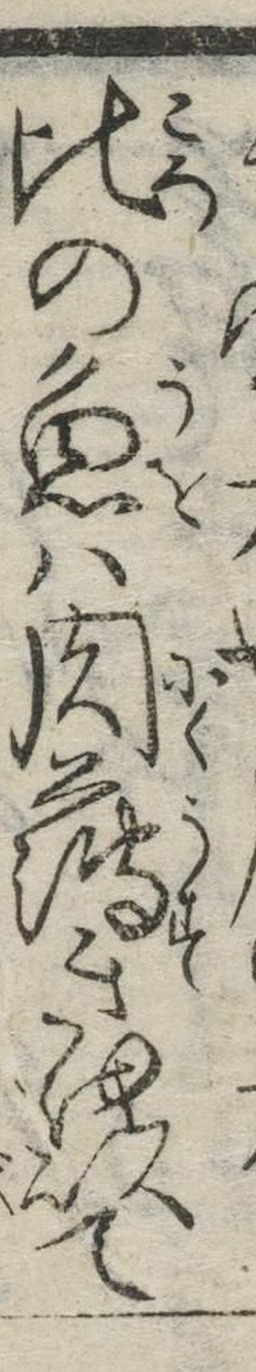比の魚は肉薄きを以て
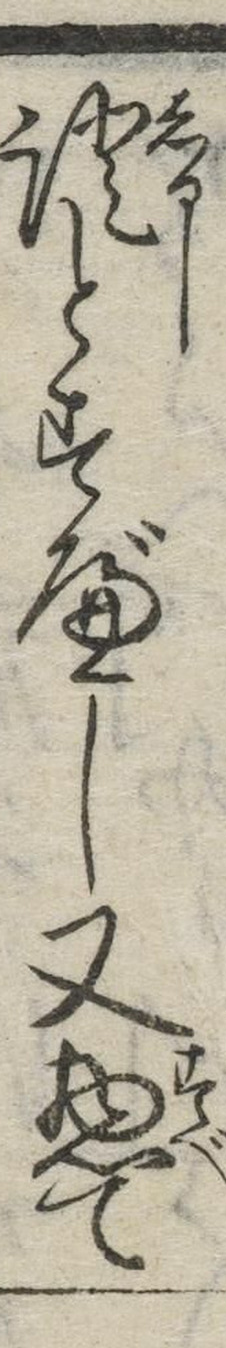證とすべし又総て
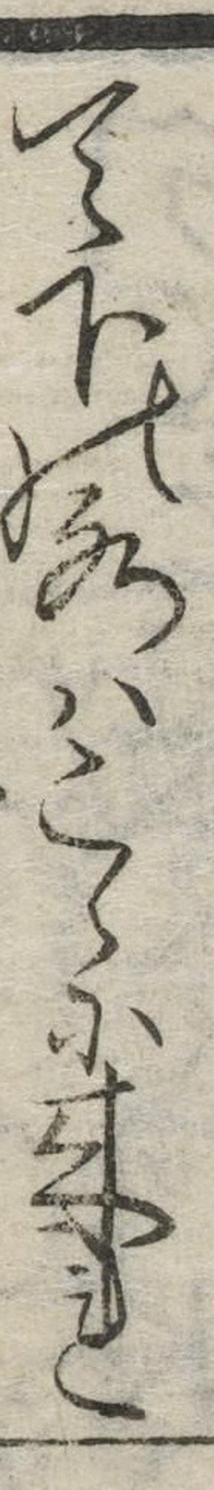天下の道はこゝに来れ
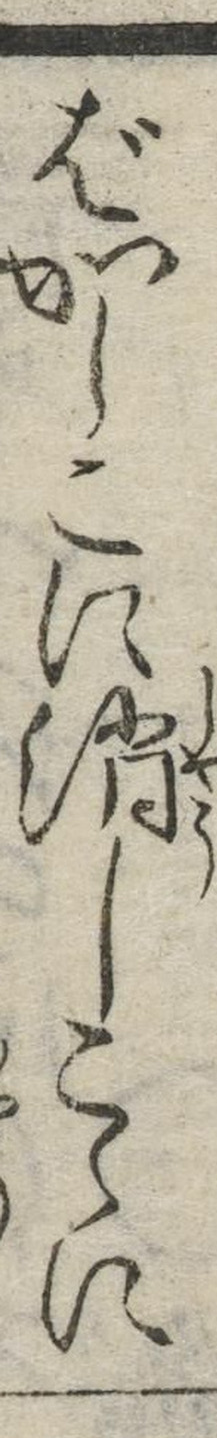ばかしこに消しこゝに
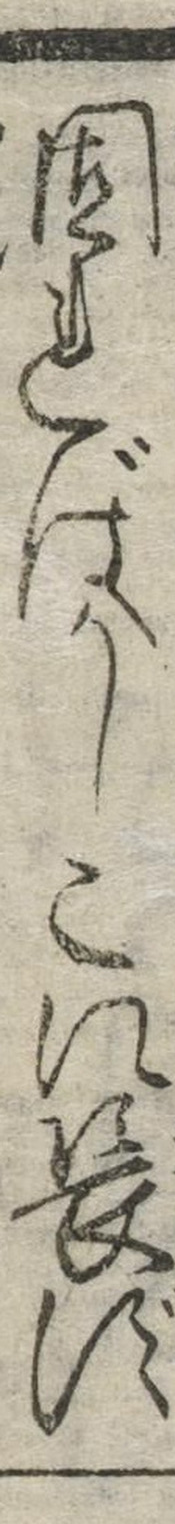涸ればかしこに長ず
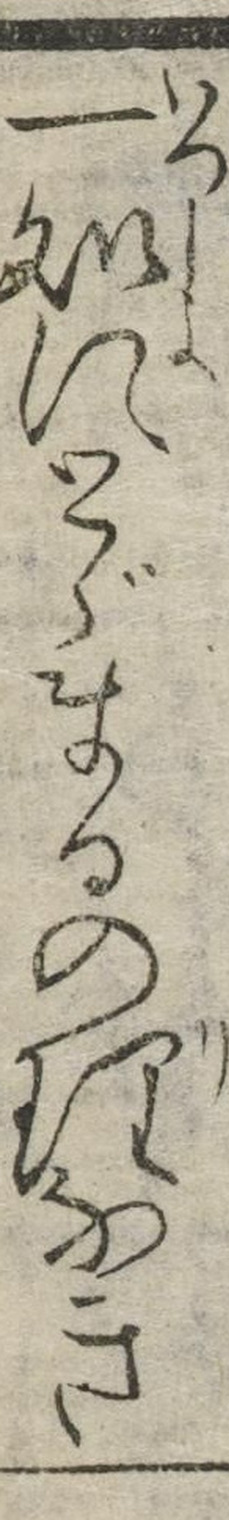一処にと〴〵まるの理なき
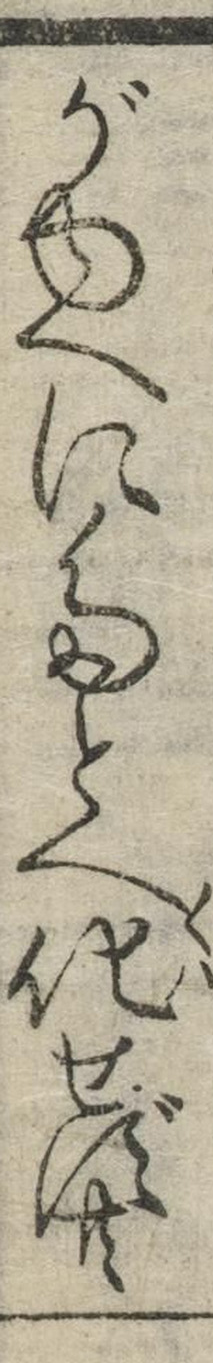がゆへにたとへ化せずとも

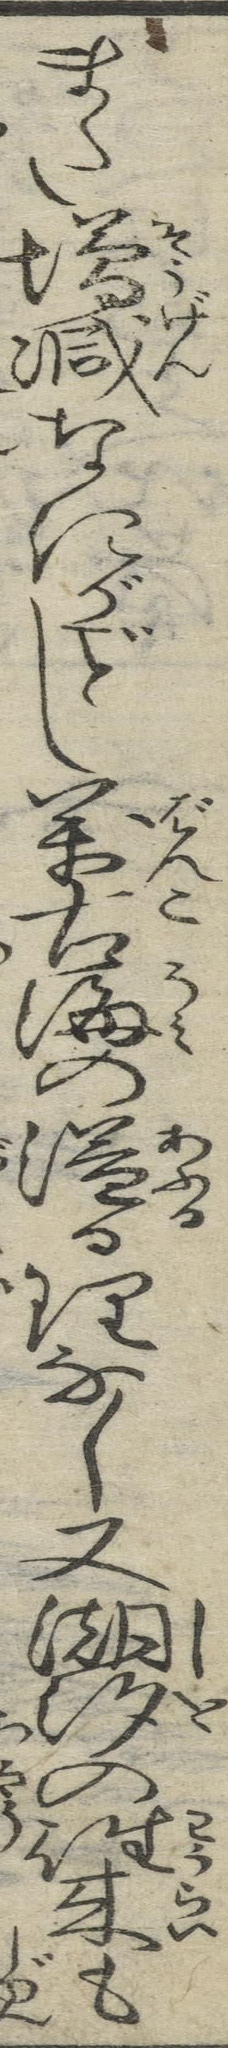また増減なきがごとし萬古海の溢る理なし又潮汐の往来も
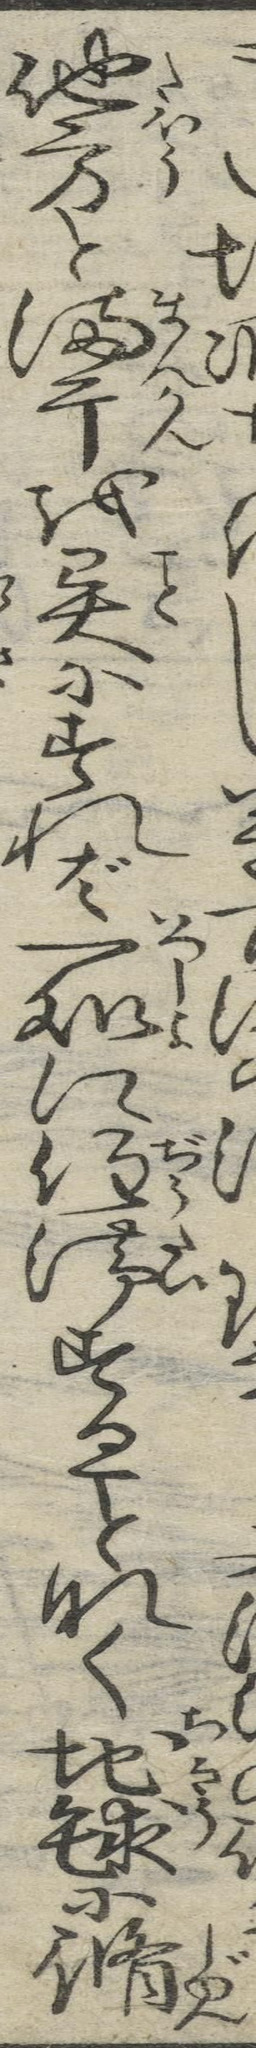他方と満干を異にすれば一処に渋滞することなく地球に循
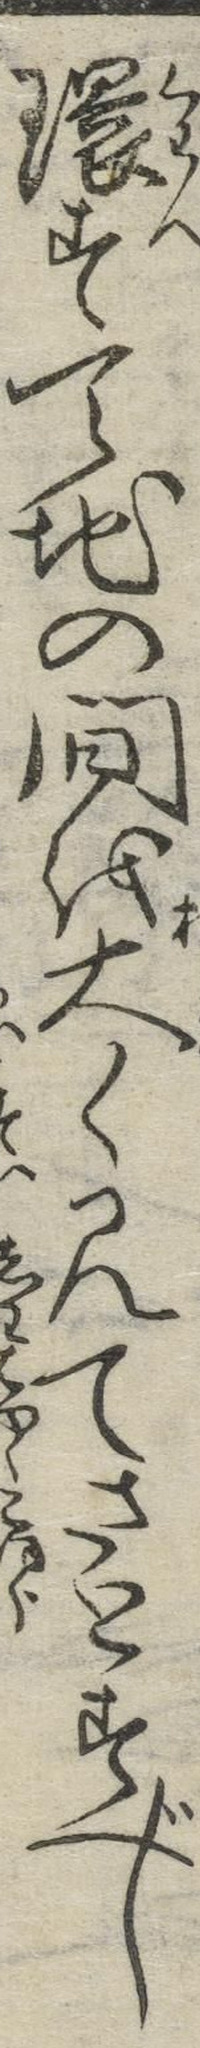環す天地の間を大く見てさとすべし
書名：訓蒙天地辨　地
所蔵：東京大学地震研究所図書室 Earthquake Research Institute Library, The University of Tokyo, JAPAN
